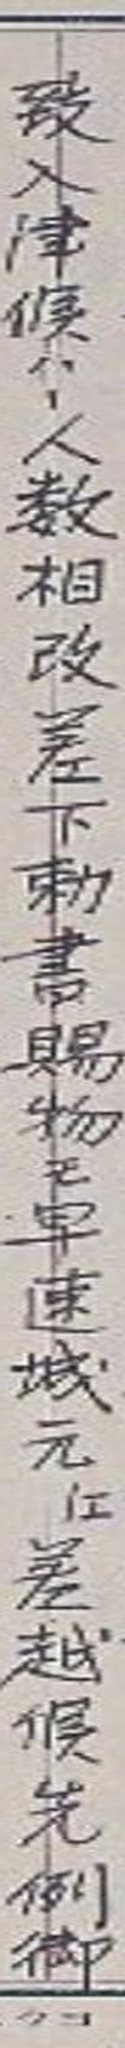致入津候はゝ人数相改差下勅書賜物も早速城元え差越候先例御
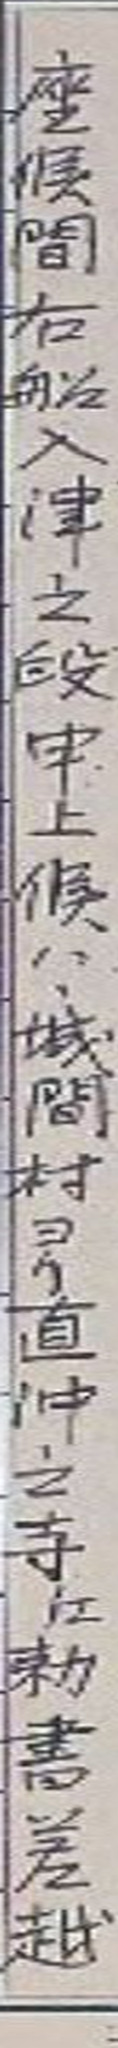座候間右船入津之段申上候はゝ城間村より直沖之寺え勅書差越
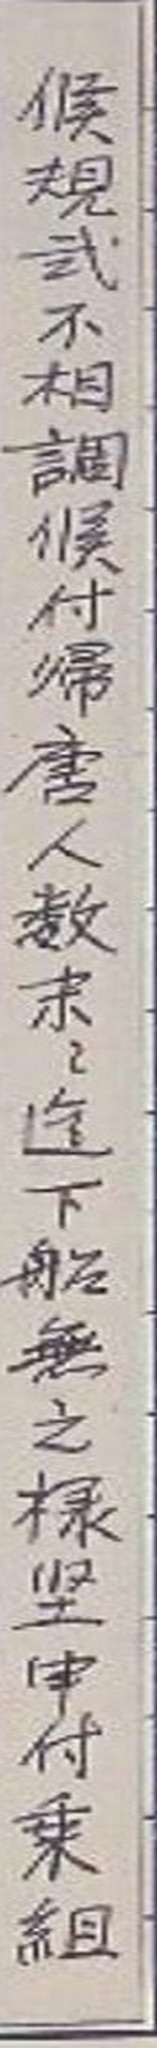候規式不相調候付帰唐人数末々迄下船無之様堅申付乗組
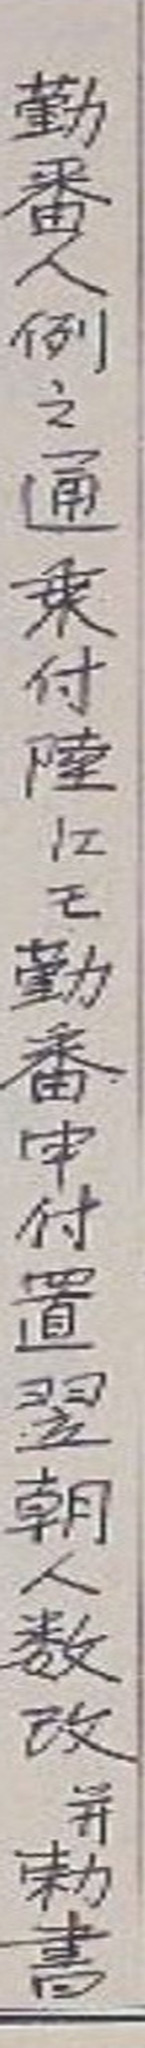勤番人例之通乗付陸えも勤番申付置翌朝人数改并勅書
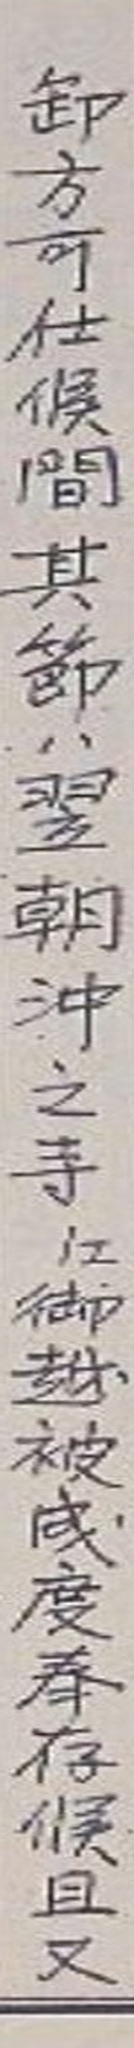卸方可仕候間其節は翌朝沖之寺え御越被成度奉存候且又
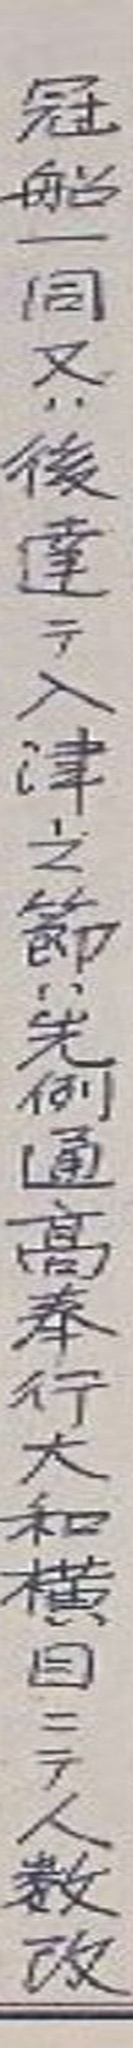冠船一同又は後達て入津之節は先例通高奉行大和横目にて人数改
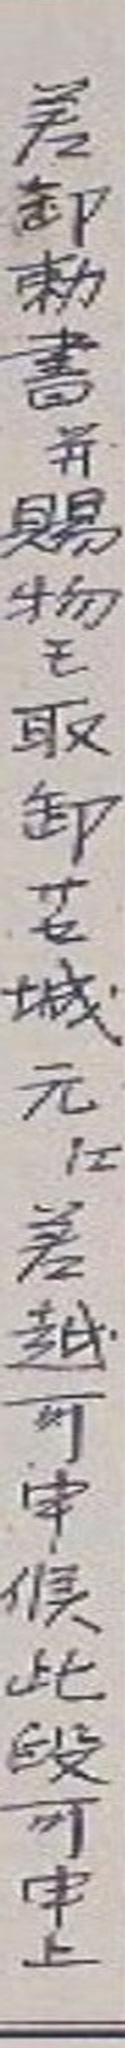差卸勅書并賜物も取卸させ城元え差越可申候此段可申上
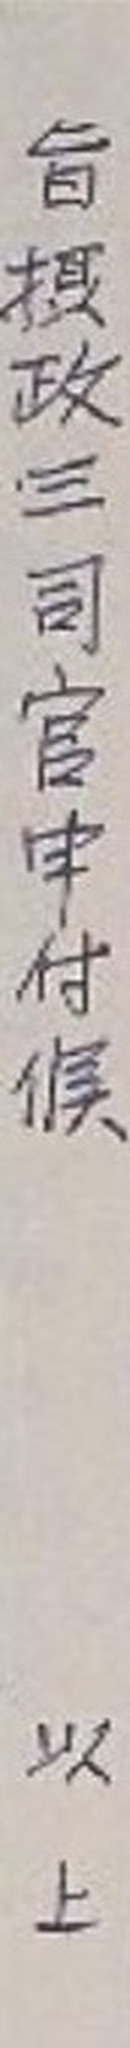旨摂政三司官申付候以上
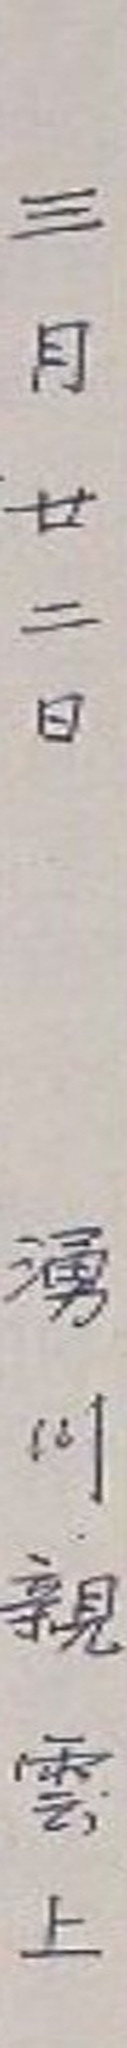三月廿二日湧川親雲上
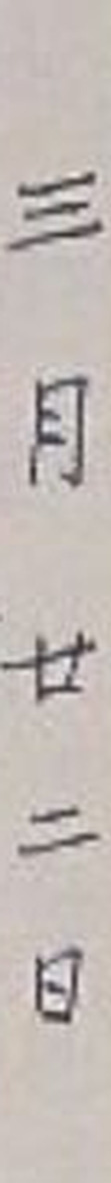三月十七日
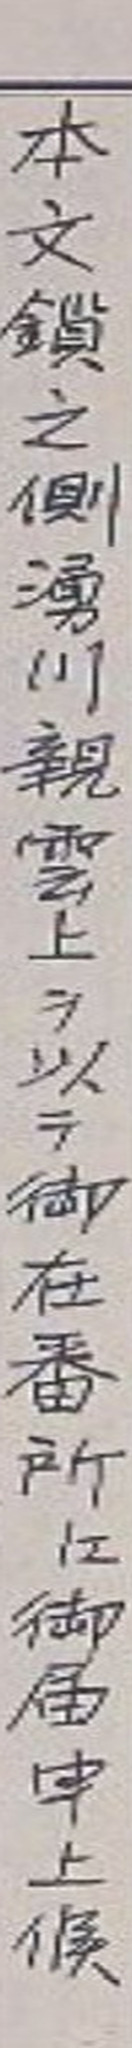本文鎖之側湧川親雲上を以て御在番所え御届申上候
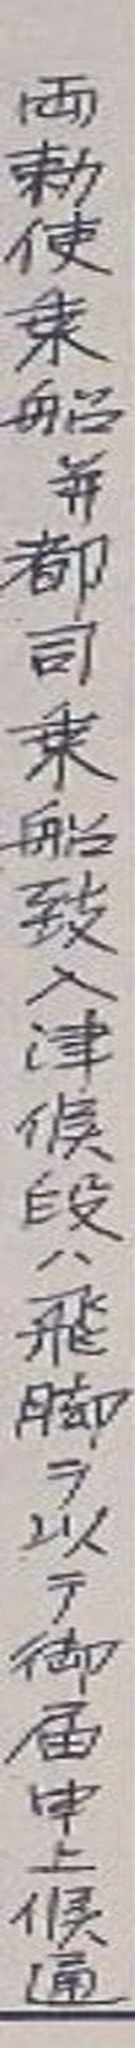両勅使乗船并都司乗船致入津候段は飛脚を以て御届申上候通
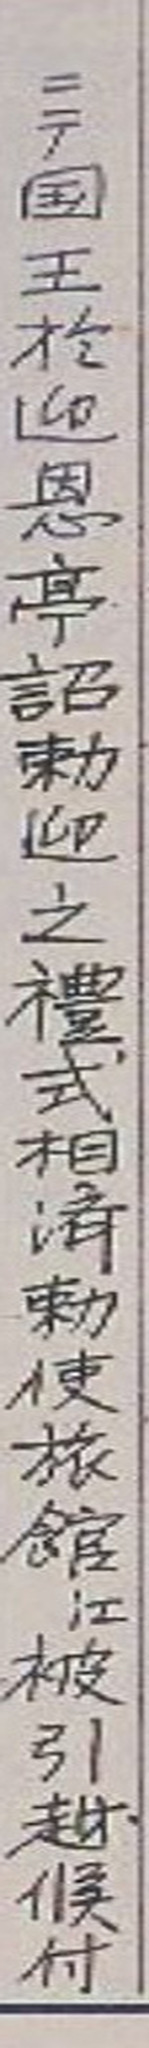にて国王於迎恩亭詔勅迎之礼式相済勅使旅館え被引越候付
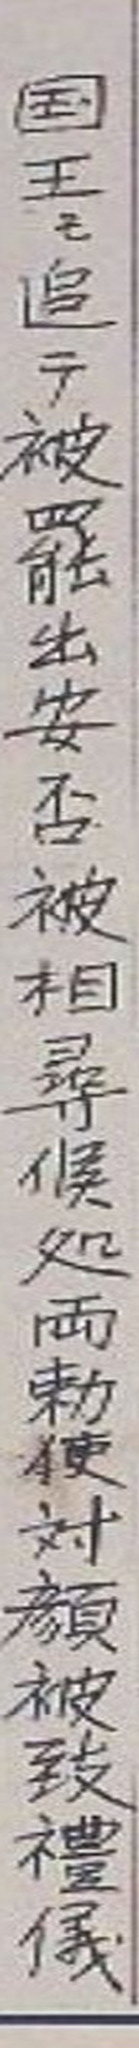国王も追て被罷出安否被相尋候処両勅使対顔被致礼儀
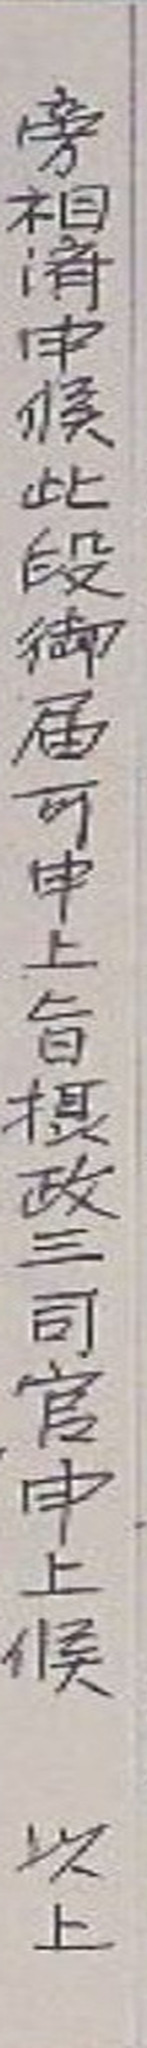旁相済申候此段御届可申上旨摂政三司官申上候以上
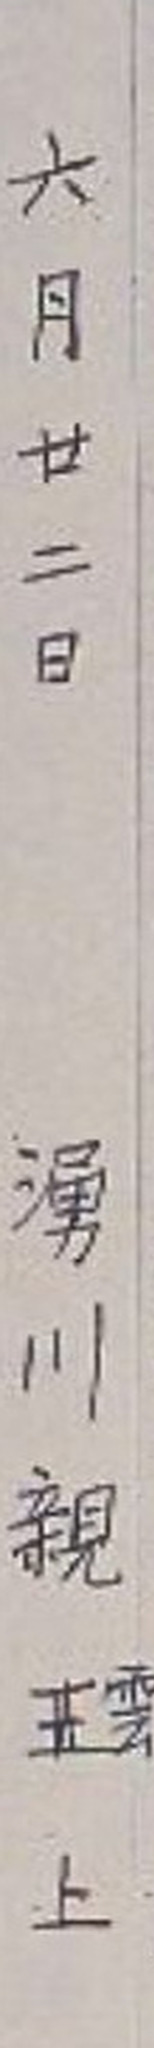六月廿二日湧川親雲上
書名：支那冊封使来琉諸記 下巻
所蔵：University of the Ryukyus Library
